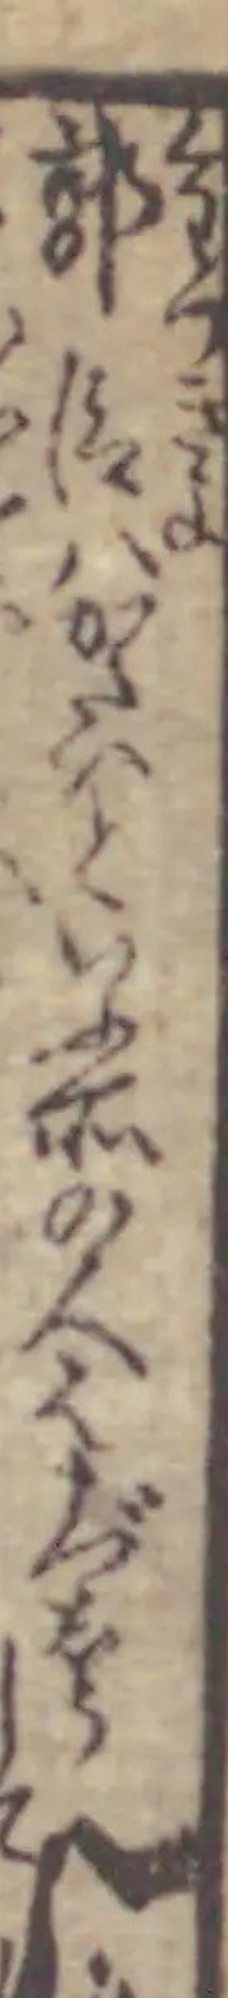郭清はかたいといふ所の人也まづしうして
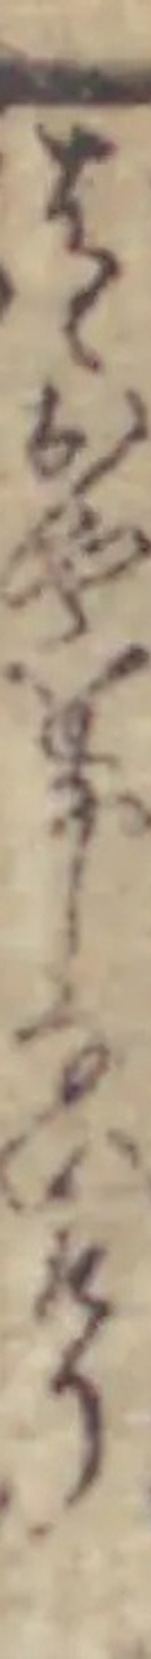はゝおやをやしないけり
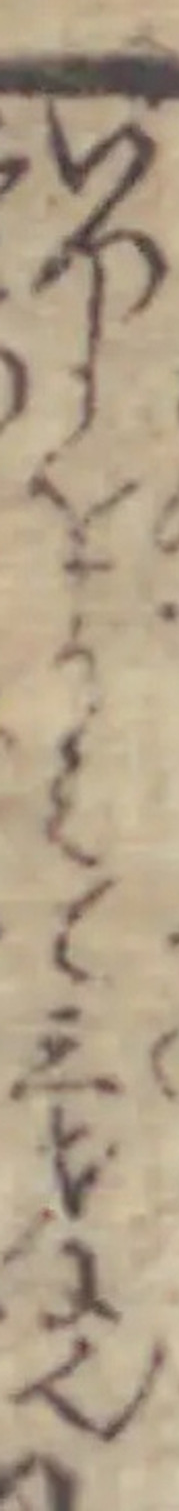いつしをうみて三才に也
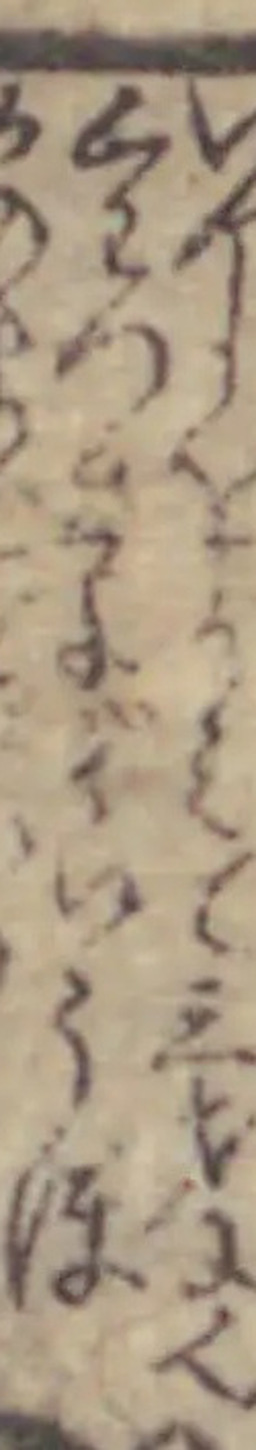くわつきよいうほ
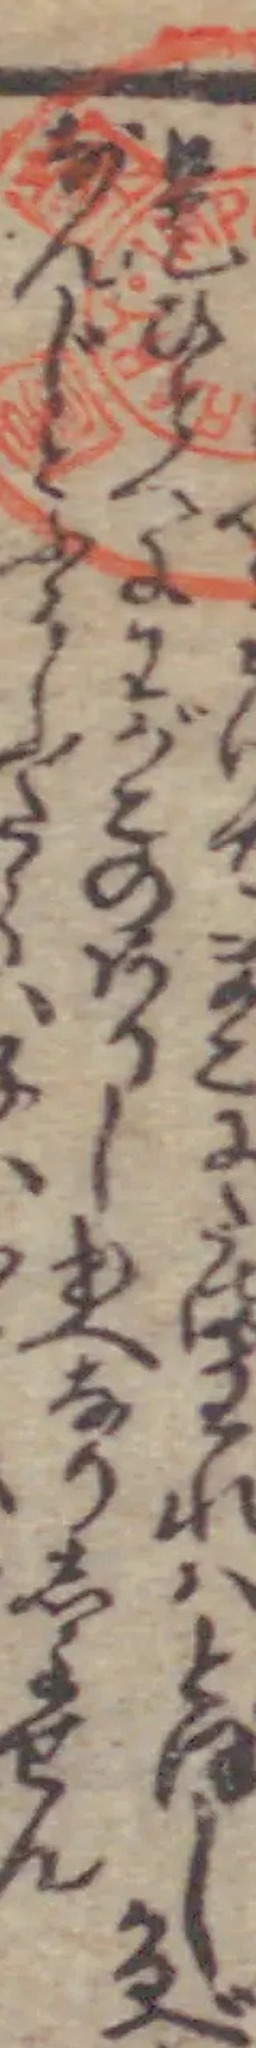是ひとへにわがこのありしゆへなりしよせん
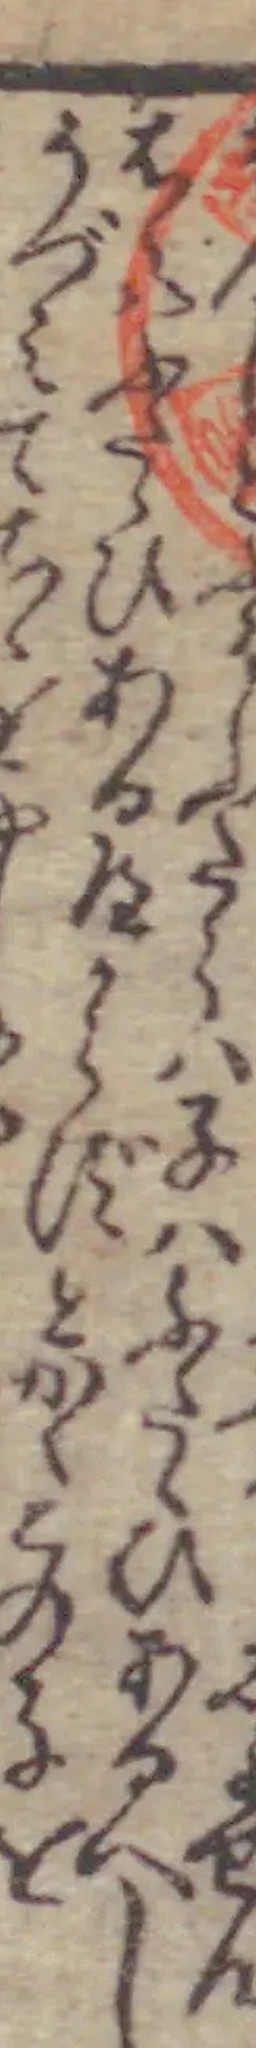はゝはふたゝひあるへからずとかくこの子を
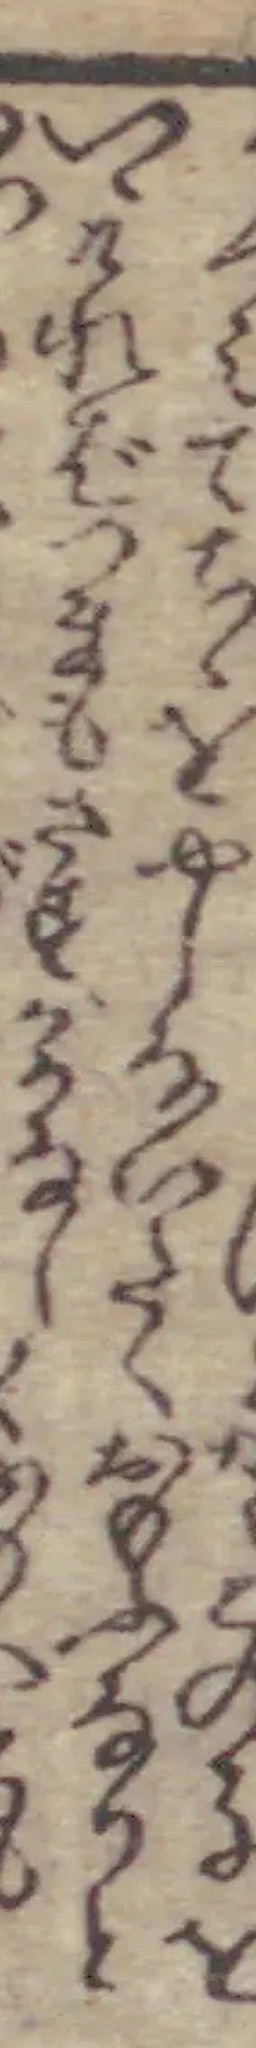いゝければつまもさすがかなしくおもへとも
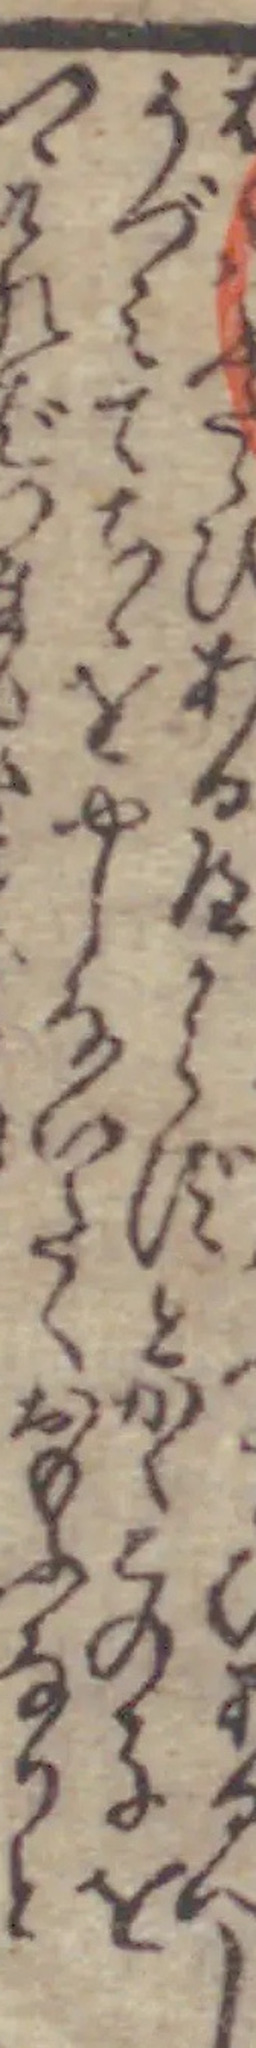うづみてちゝをやしないたくおもふなりと
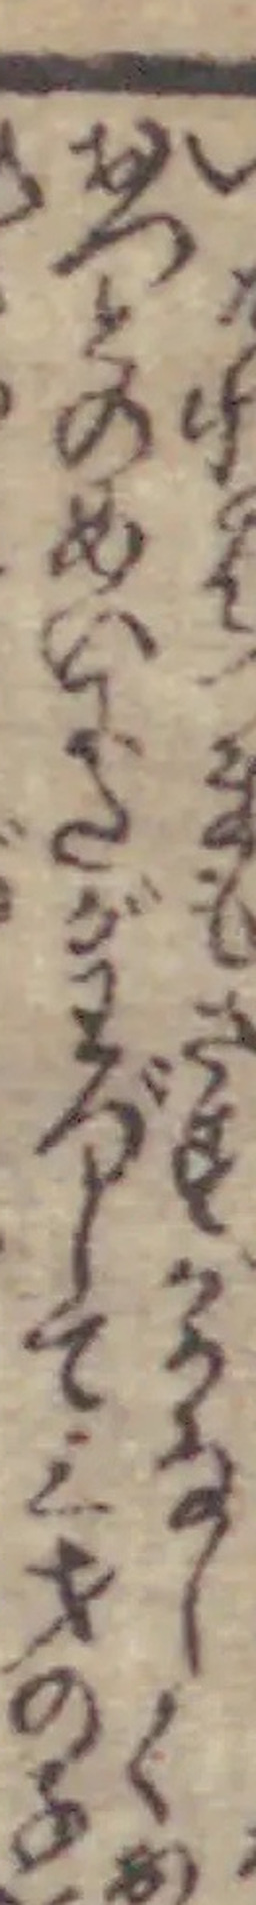おつとのめいにたがわづして三才の子を
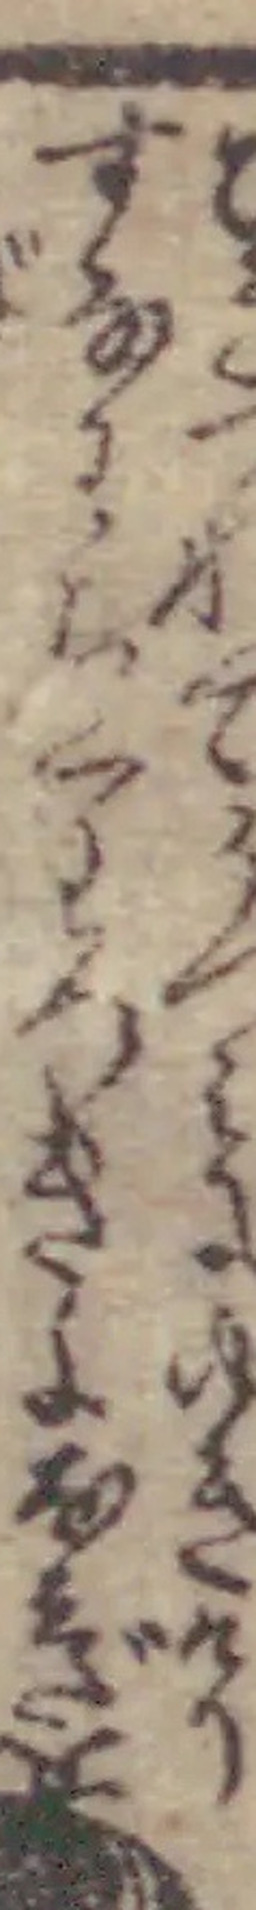すなわちくわつきよなみだを
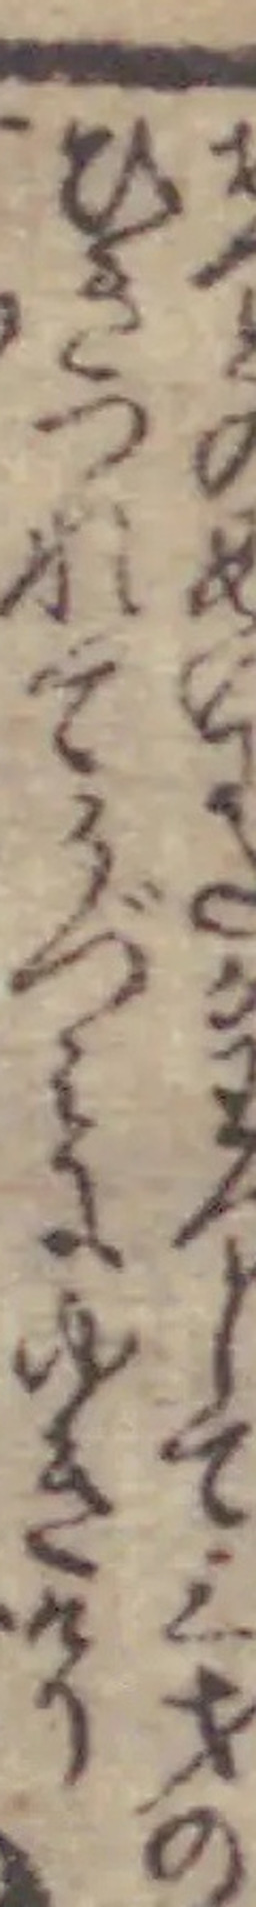ひきつれてうづみにゆきけり
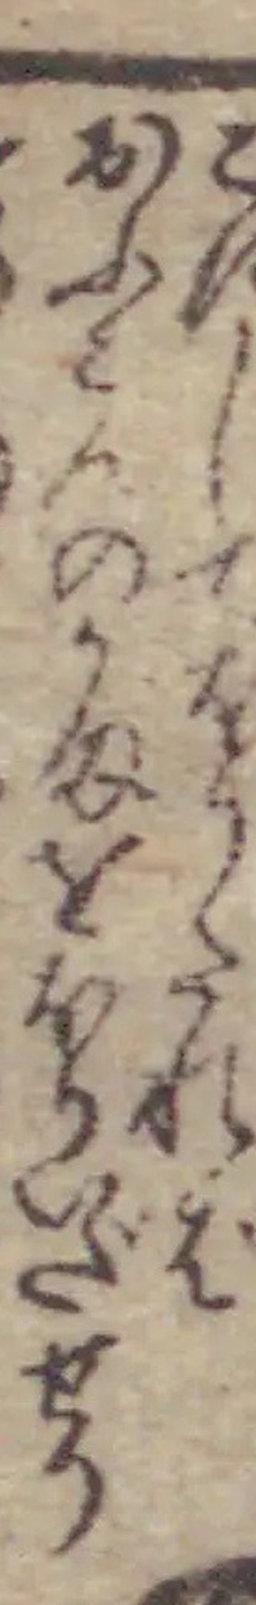おふこんのかまをほりいだせり
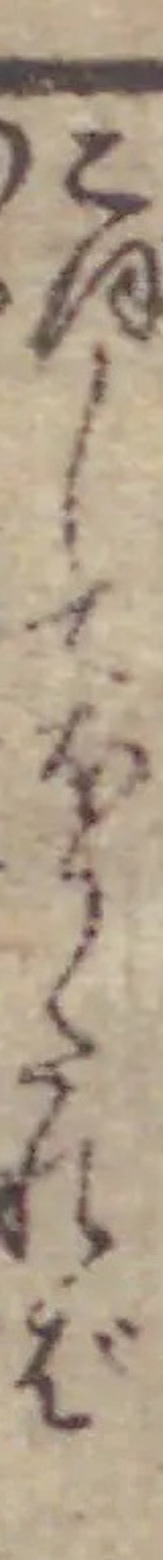こぼしてほりたれば
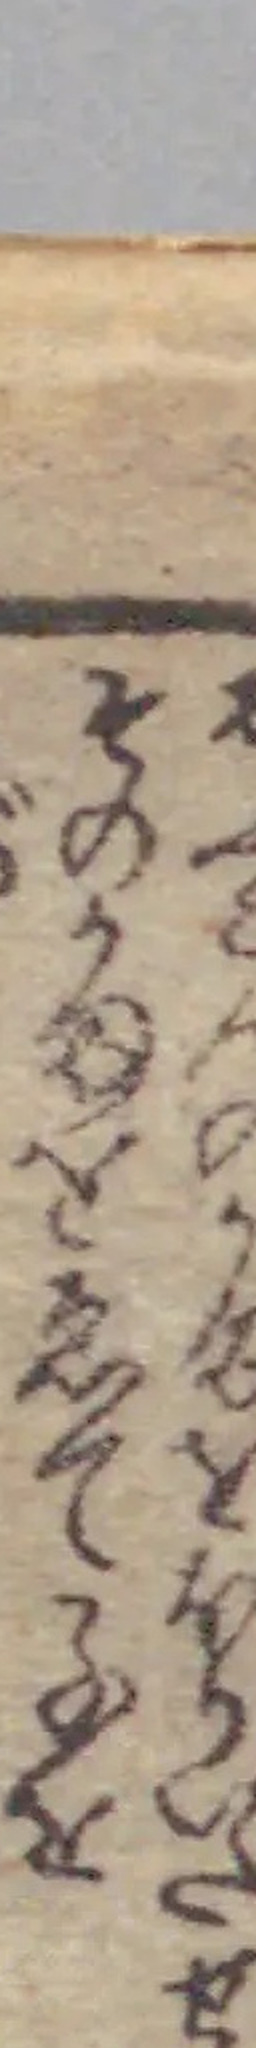そのかまをゑて子を
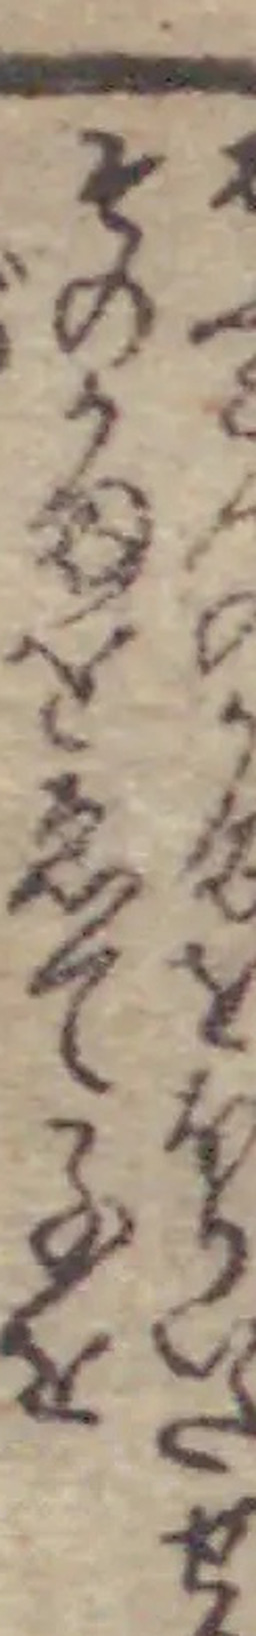そのかまをゑて子を
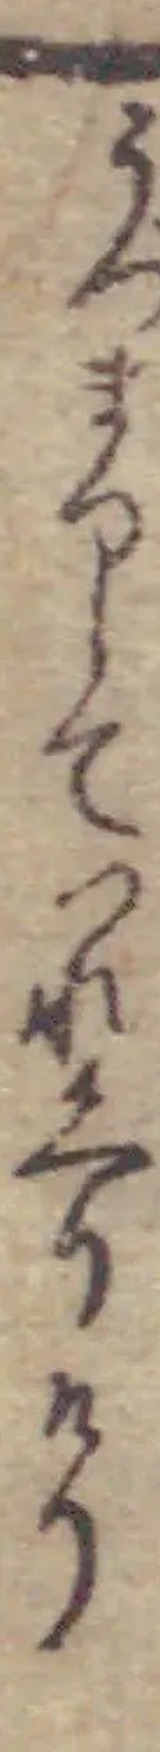うづまつしてつれかへりけり
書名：間違月夜鍋 2巻
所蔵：国立国会図書館 National Diet Library, JAPAN
